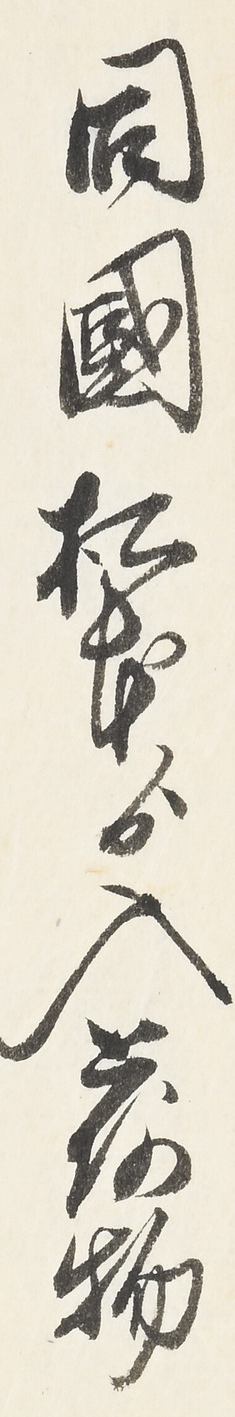同國松本ゟ入荷物
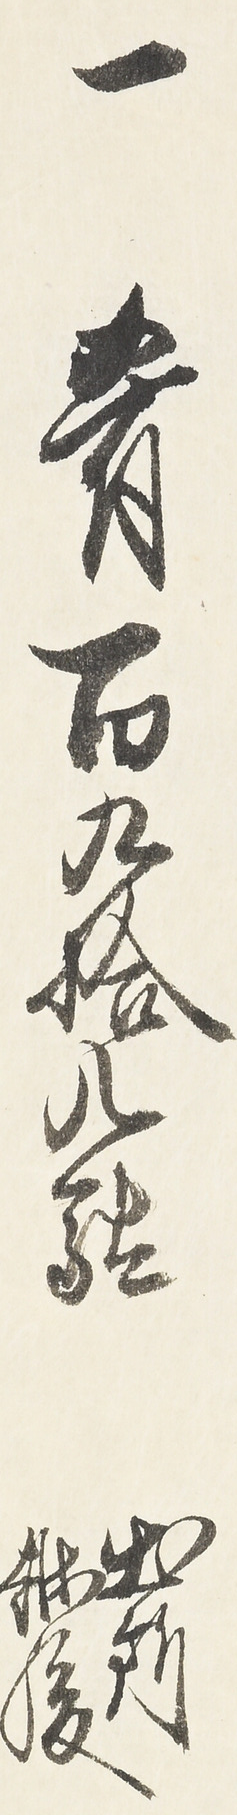一肴百九拾八駄出所
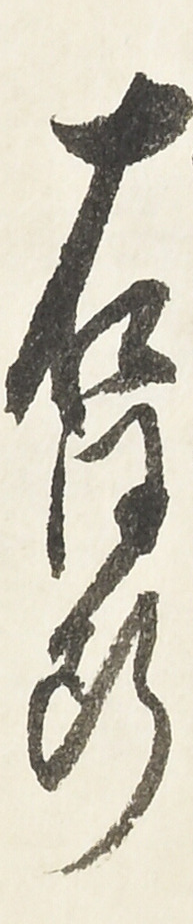右同断
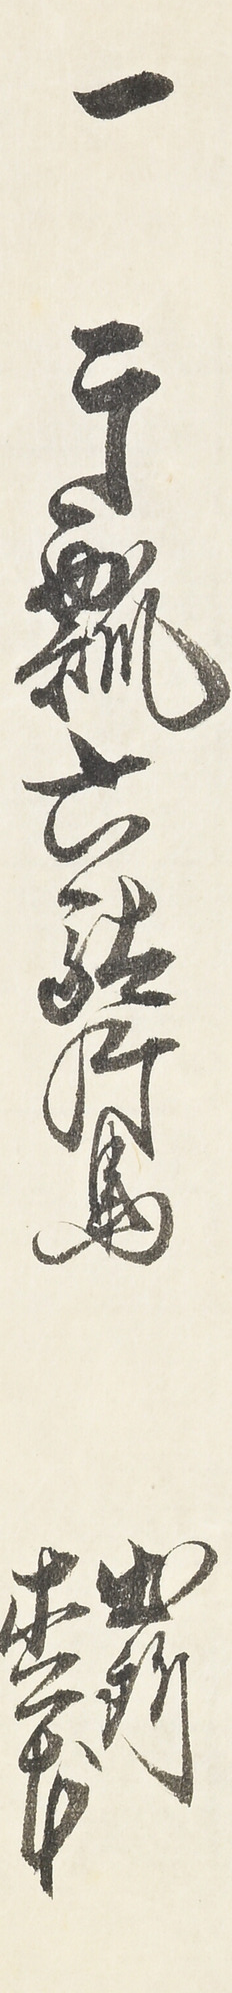一干瓢六駄片馬出所
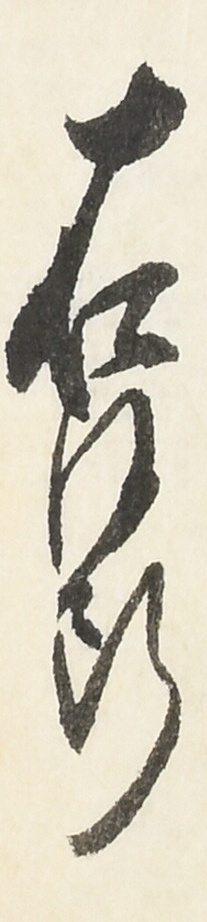右同断

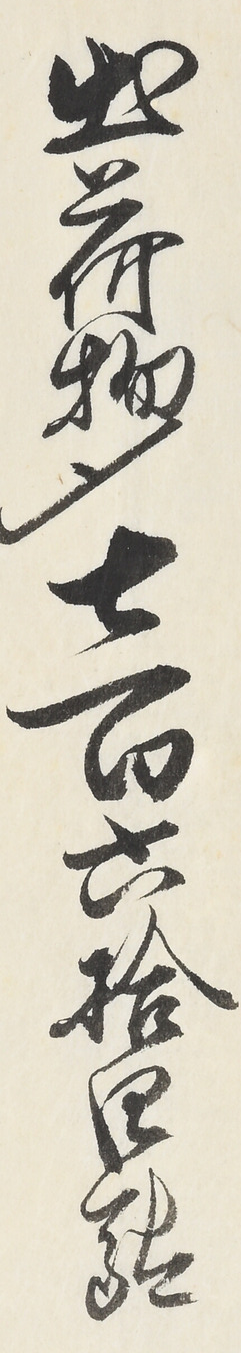出荷物〆七百六拾四駄
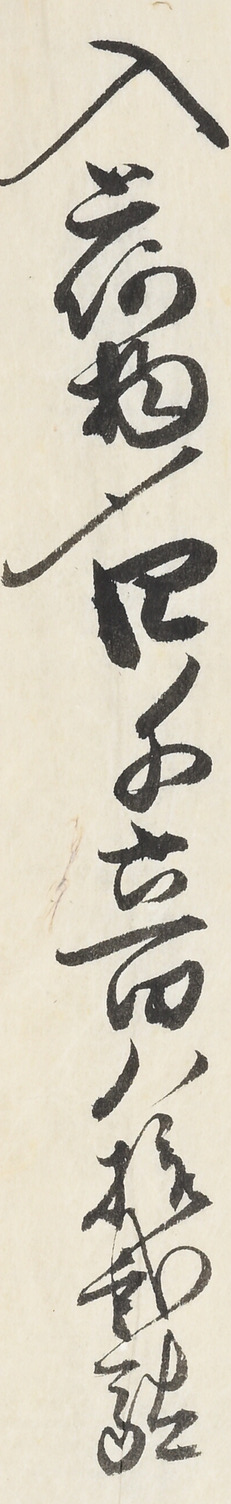入荷物〆四千六百八拾弐駄
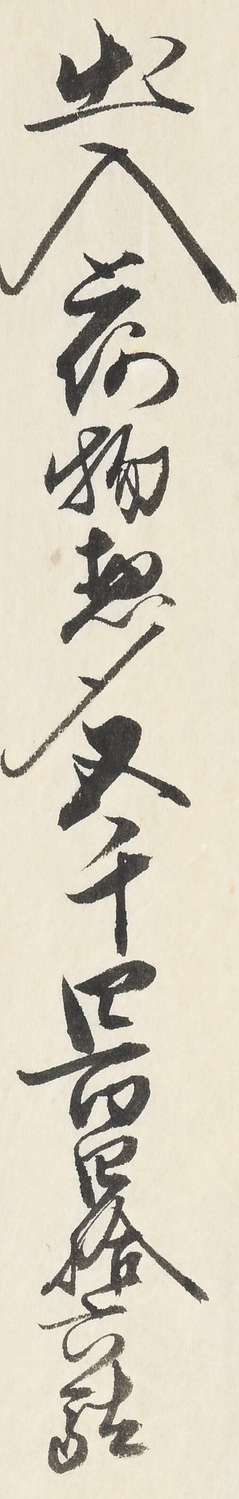出入荷物惣〆五千四百四拾六駄

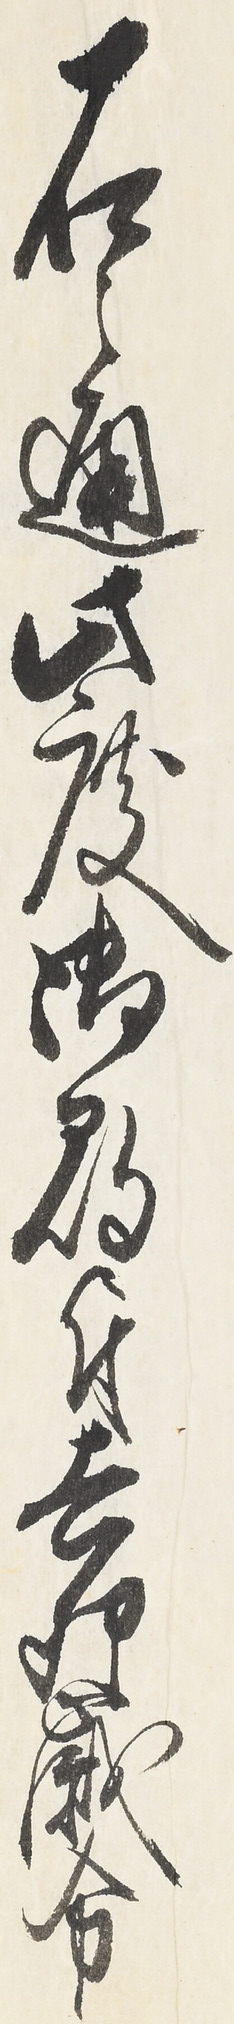右之通此度御尋ニ付去卯威令
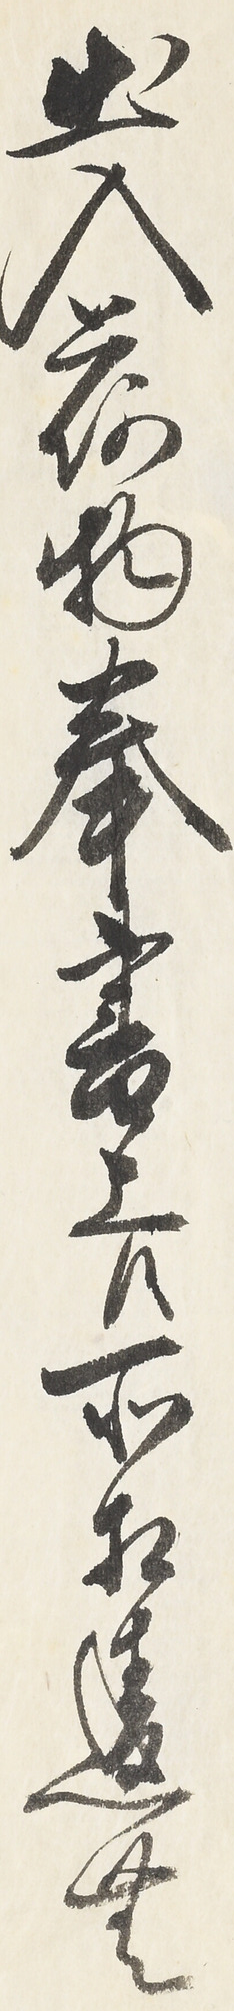出入荷物奉書上候所相違無
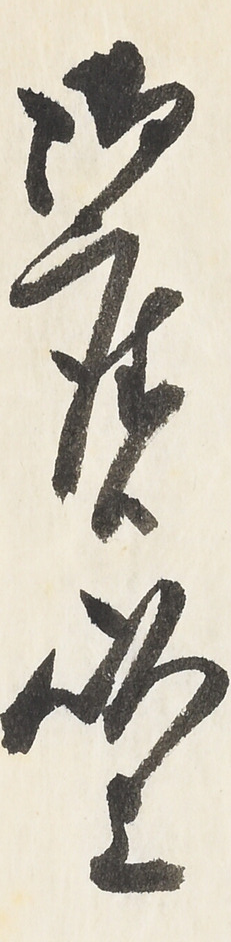御座候以上
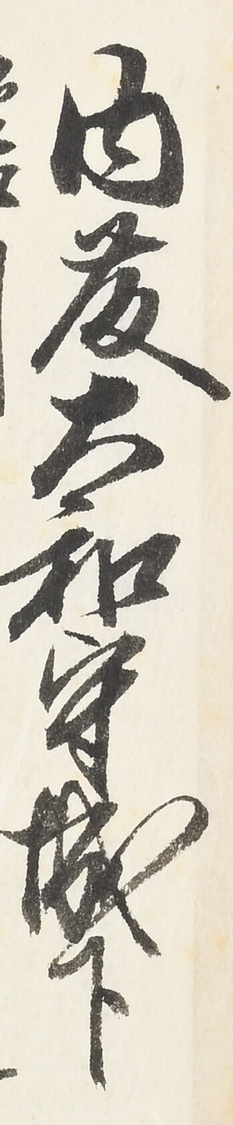内藤大和守城下
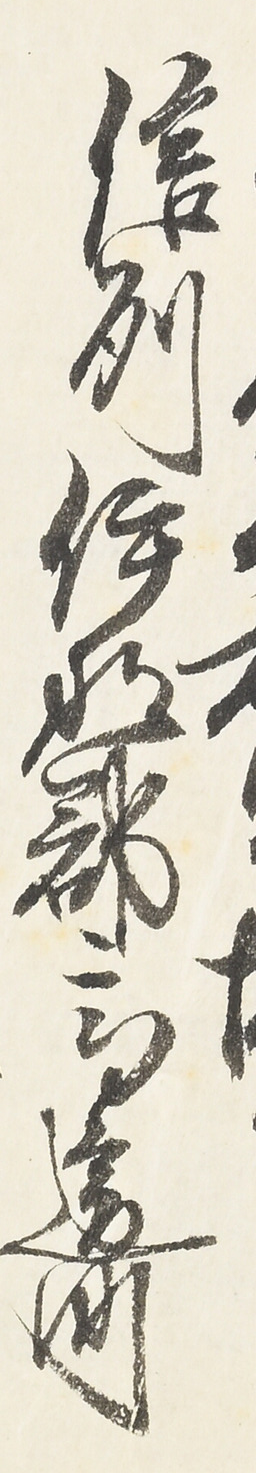信州伊那郡高遠町
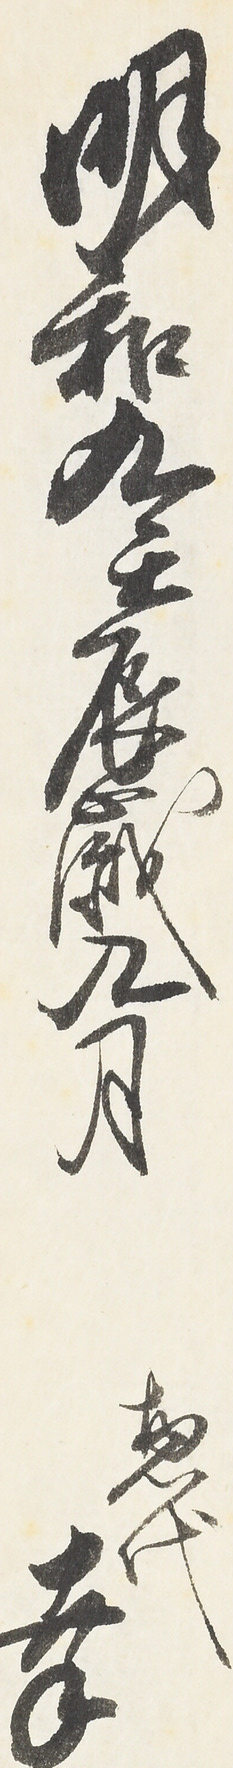明和九壬辰歳九月惣代
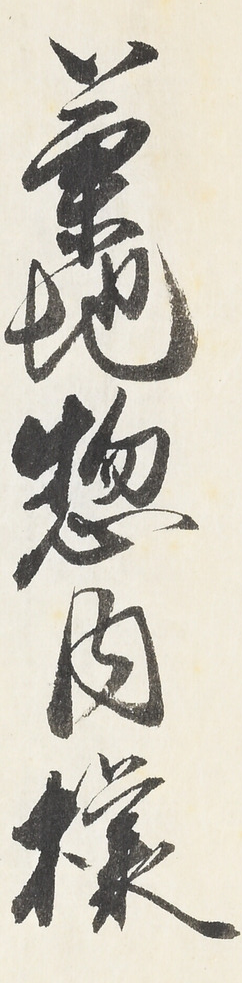菊地惣内様
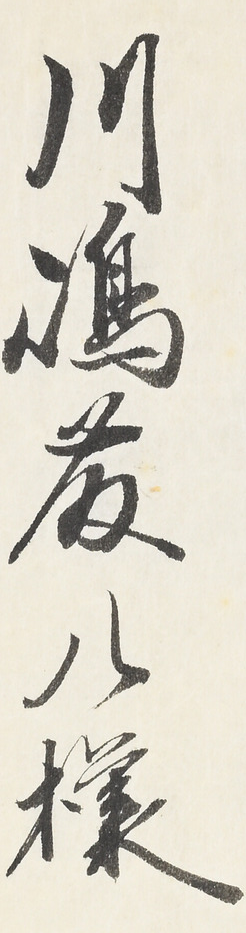川嶋藤八様
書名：中馬ニテ附通候出入荷物目録帳
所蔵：伊那市立高遠町図書館・合同会社AMANE
